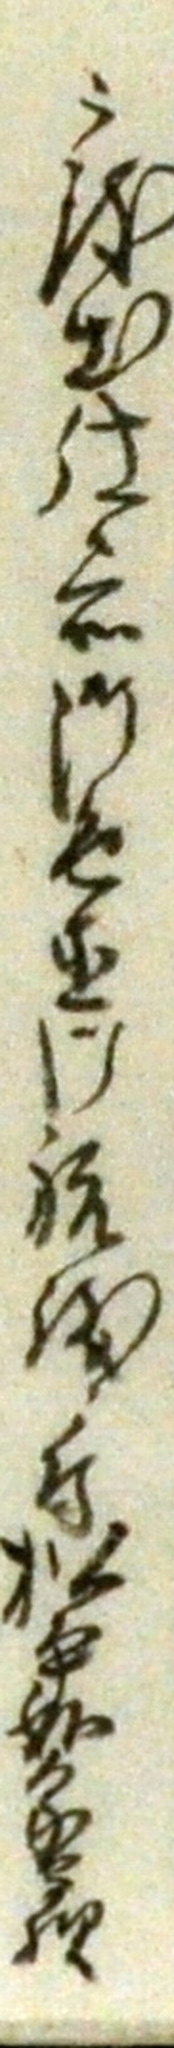被致出仕候所御色直御祝儀ニ付松平和泉守様
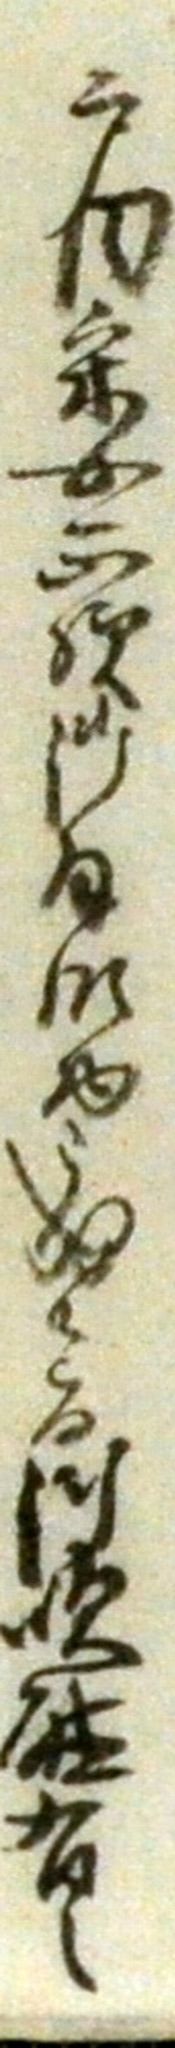戸田采女正様御拝領物被成候旨御吹聴有之
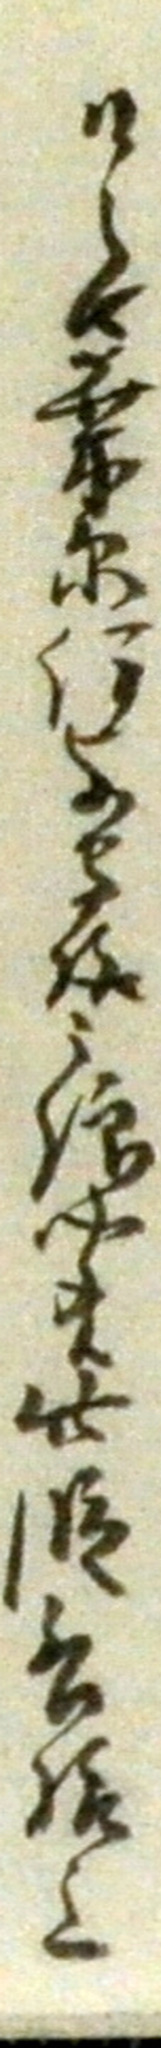候之由桑原伊与守様被仰聞候此段各様上
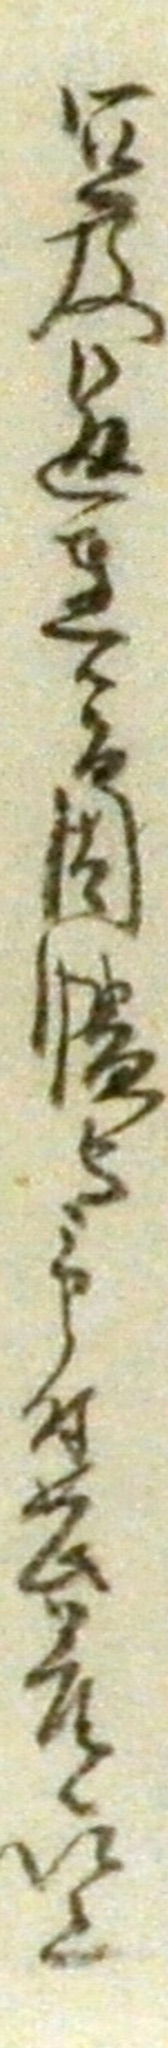宜及御通達候旨因幡守被申付如此御座候以上
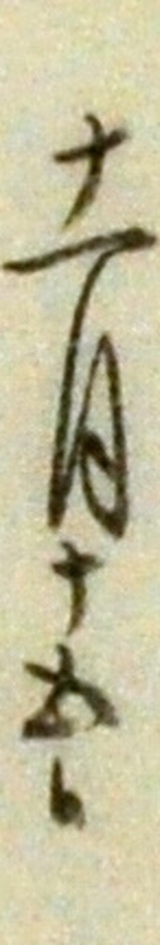十一月十五日
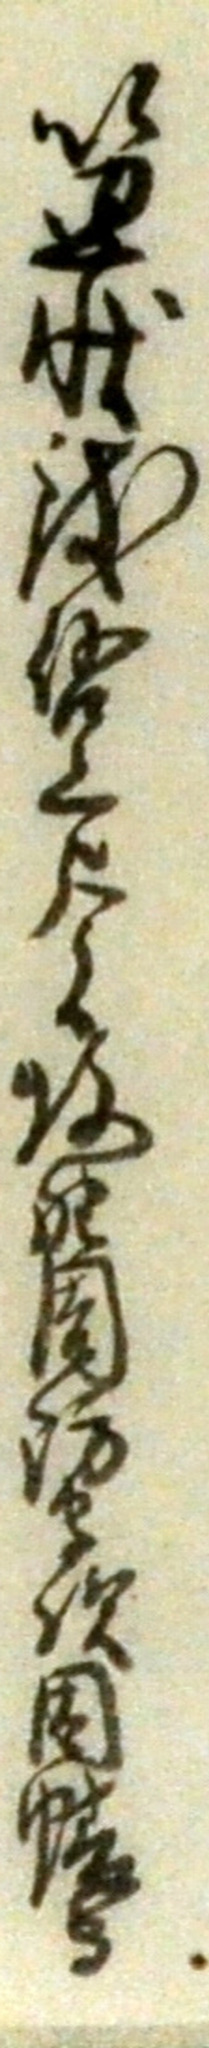以廻状致啓上候今日牧野周防守様因幡守
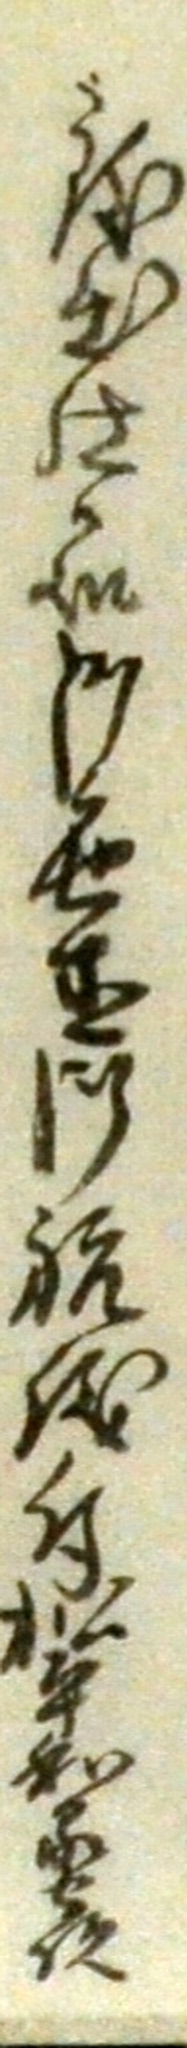被致出仕候処御色直御祝儀付松平和泉守様
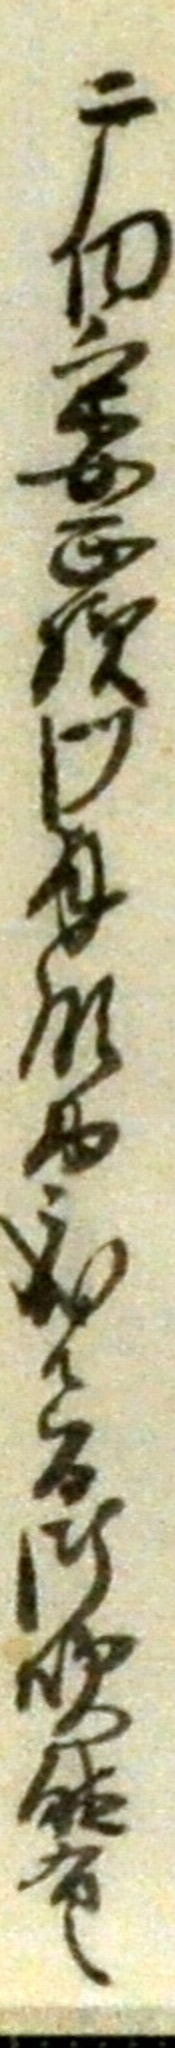戸田采女正様御拝領物被成候旨御吹聴有之
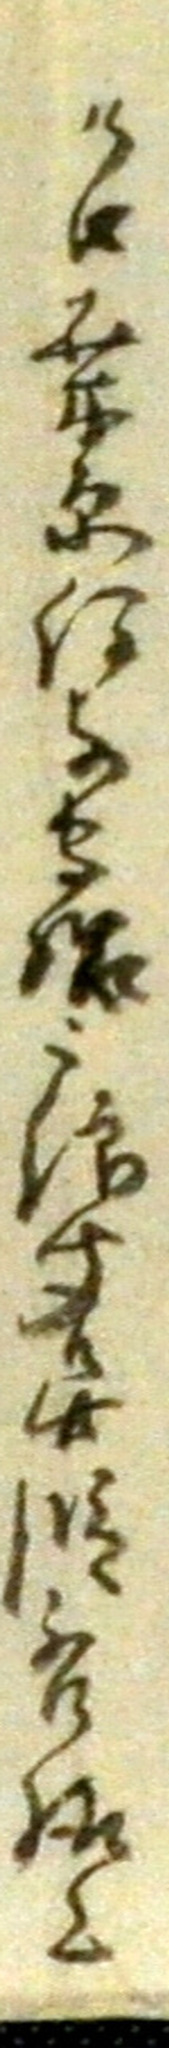候由桑原伊与守様被仰聞候此段各様上
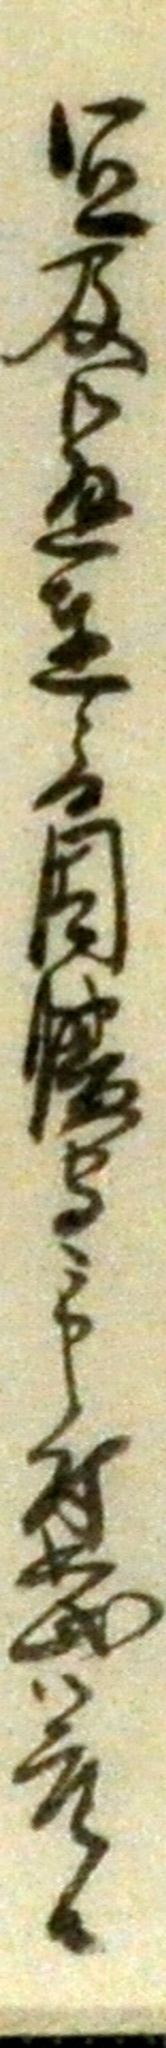宜及御通達ニ而因幡守被申付如此御座候
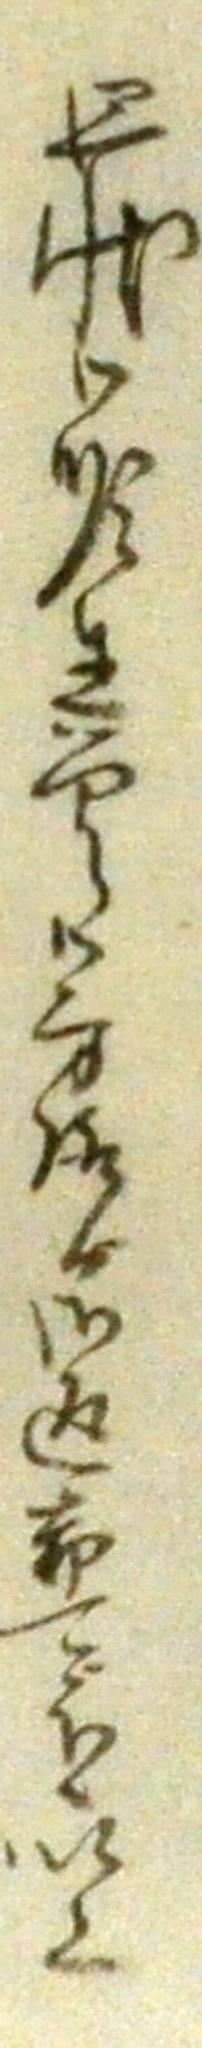廻状御順達留り御方様ゟ御返却可被下候以上
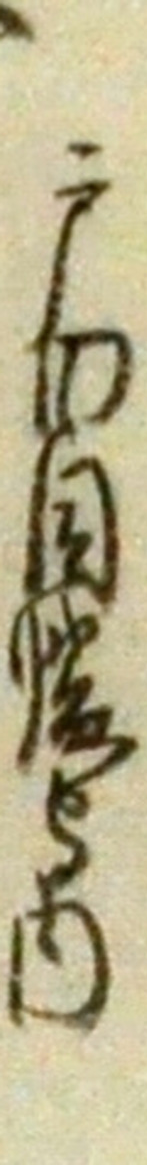戸田因幡守内
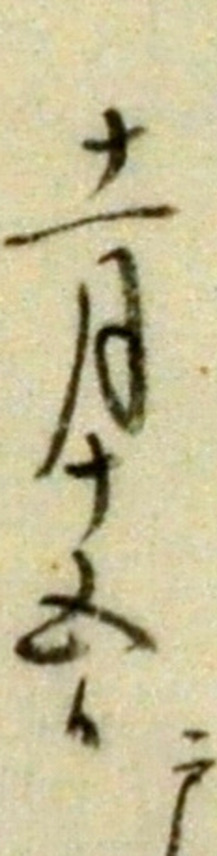十一月十五日
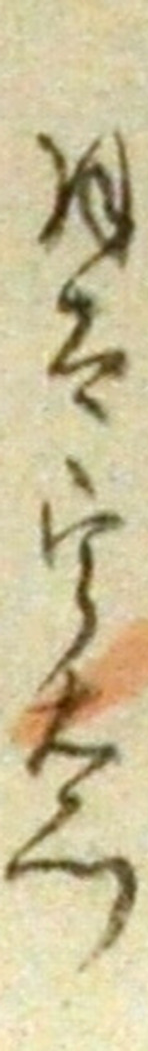羽太宇右衛門
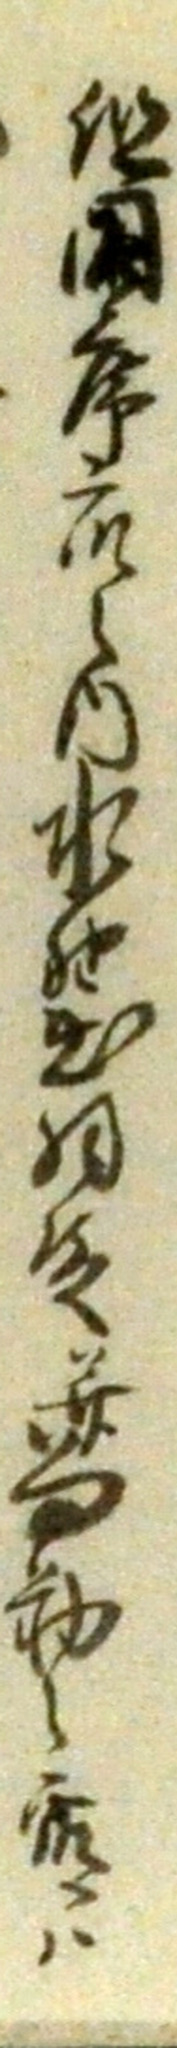但同席衆之内水野出羽殿并当勤之衆ヘハ
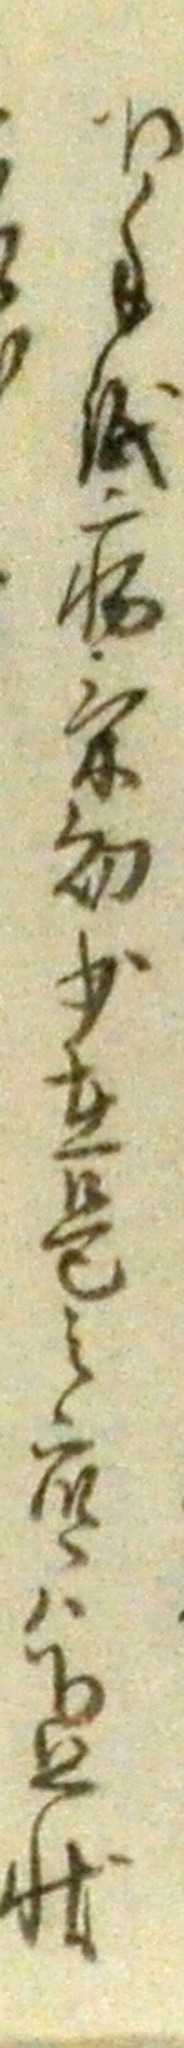下手紙病気幼少在邑之衆ヘハ下廻状
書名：若君様御色直御祝儀ノ節ノ留
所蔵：伊那市立高遠町図書館・合同会社AMANE
